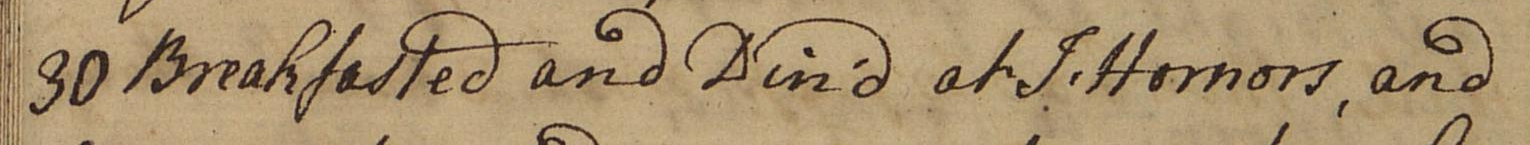30 Breakfasted and Din'd at S. Hornors, and
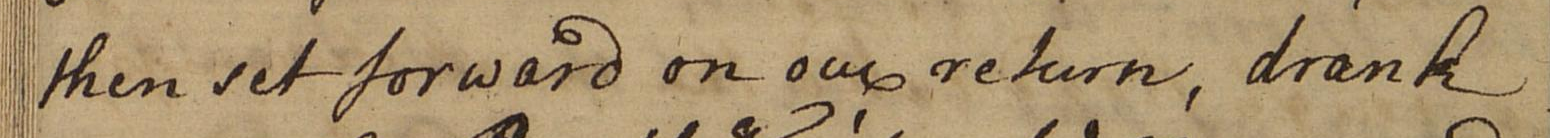then set forward on our return, drank
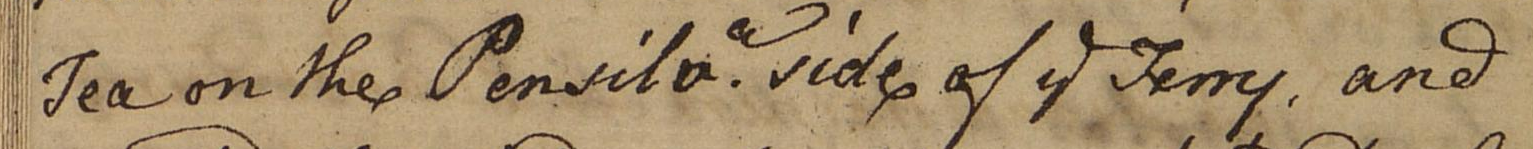Tea on the Pensilv^a. side of y^e Ferry, and
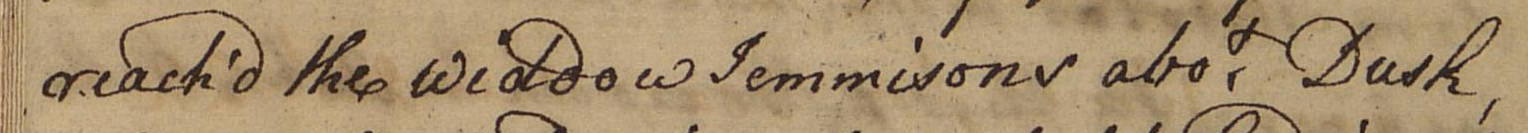reach'd the Widdow Jemmisons abo^t. Dusk,
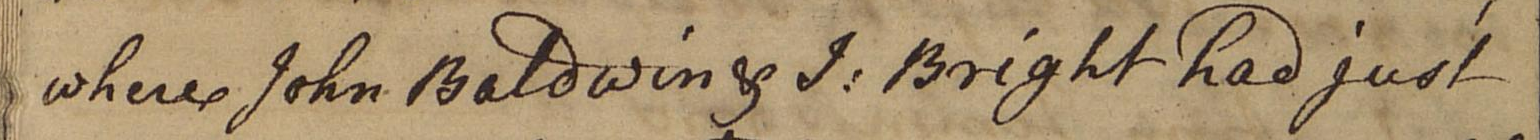where John Baldwin & I: Bright had just
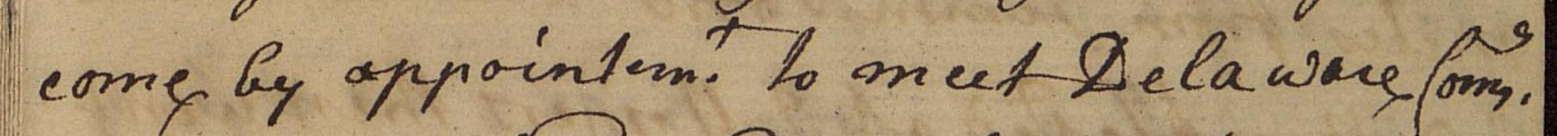come by appointem^t. to meet Delaware Comp^y.
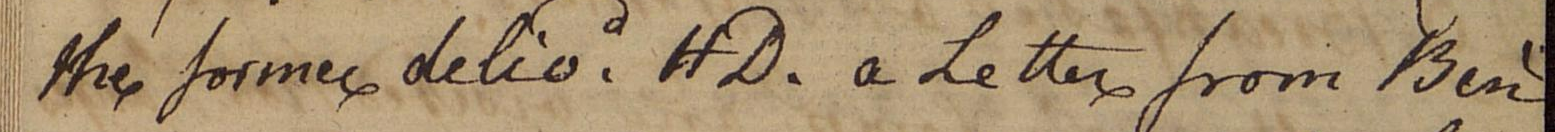the former deliv^d. H D. a Letter from Ben
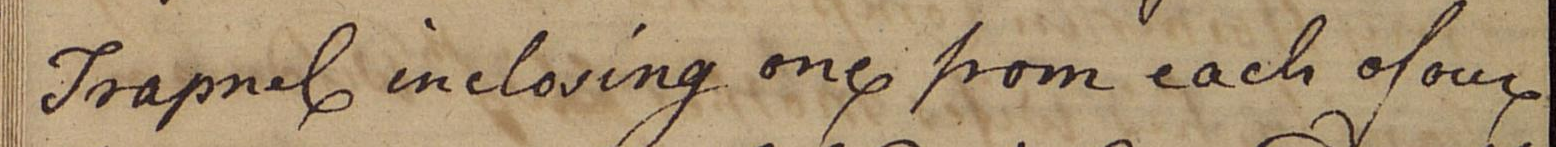Trapnel inclosing one from each of our
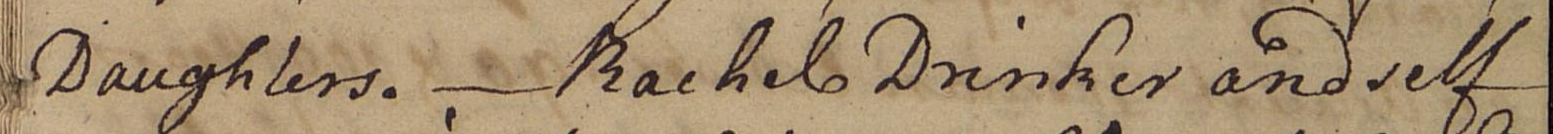Daughters.- Rachel Drinker and self
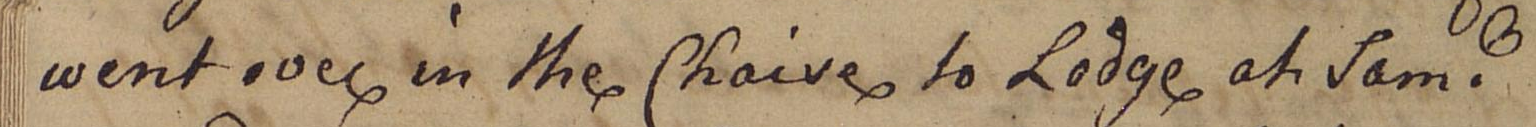went over in the Chaise to Lodge at Sam^l.
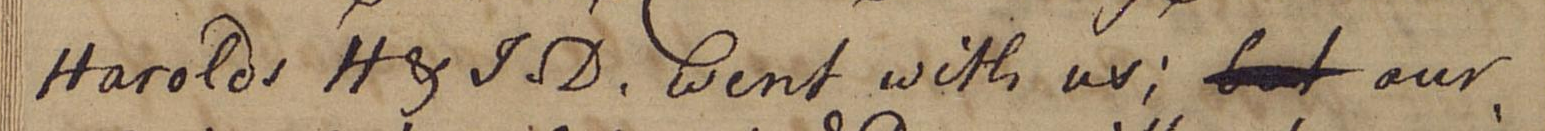Harolds H & ID. went with us; [but] our,
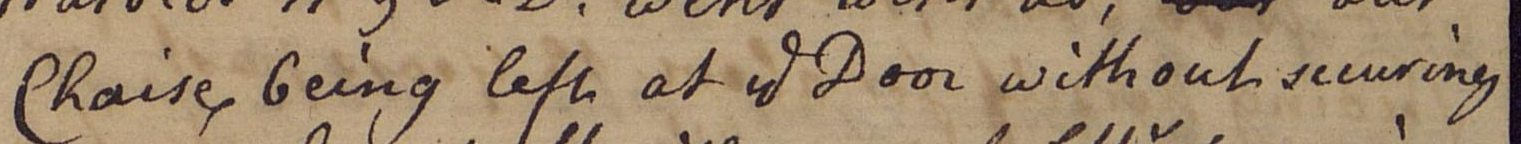Chaise being left at y^e Door without securing
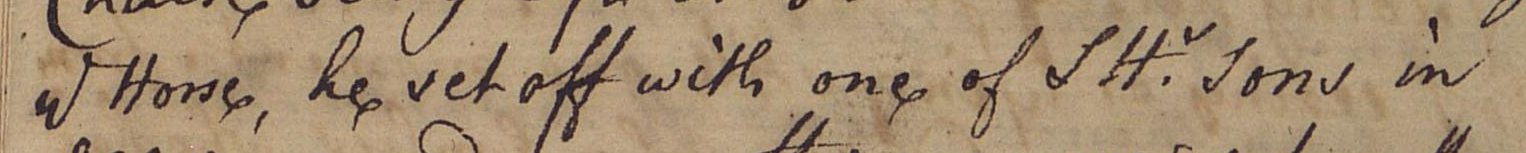y^e Horse, he set off with one of IH^s. Sons in
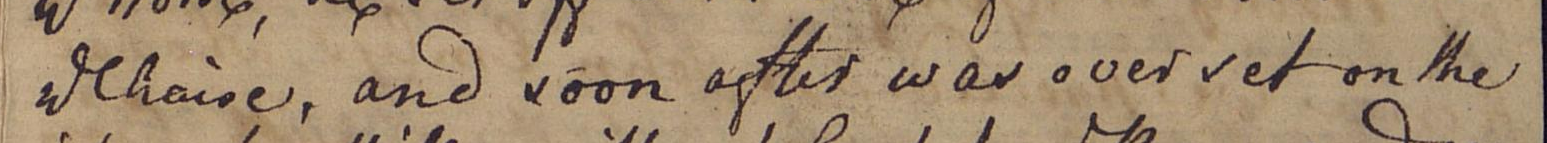y^e Chaise, and soon after was over set on the
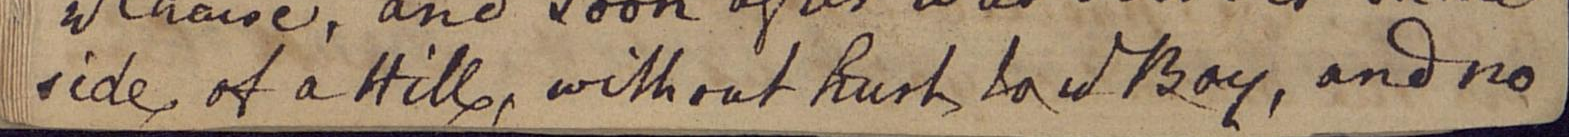side of a Hill, without hurt to y^e Bay, and no
